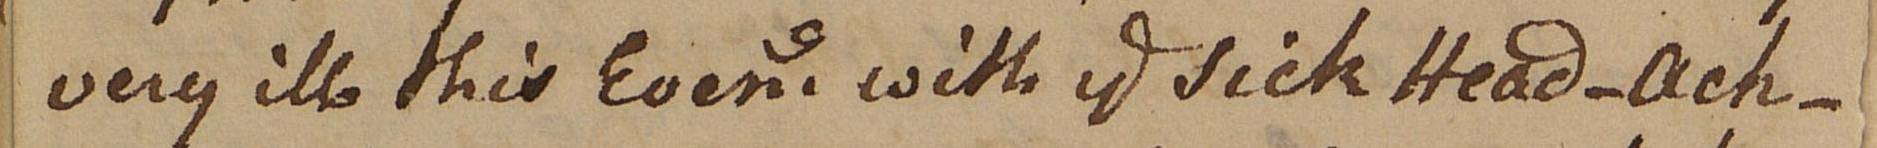very ill this Even^g. with y^e sick Head- Ach-
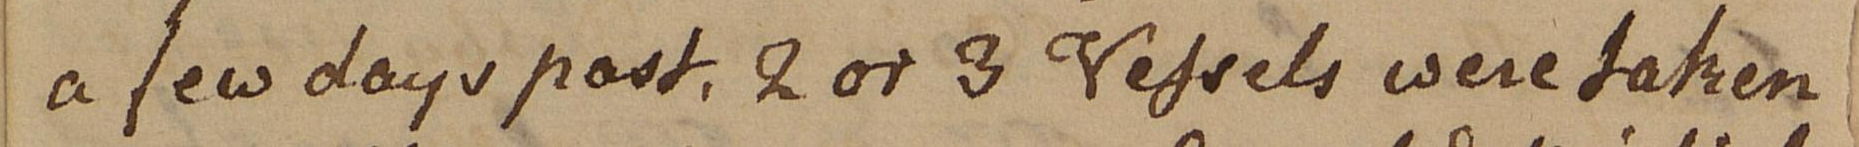a few days past, 2 or 3 Vessels were taken
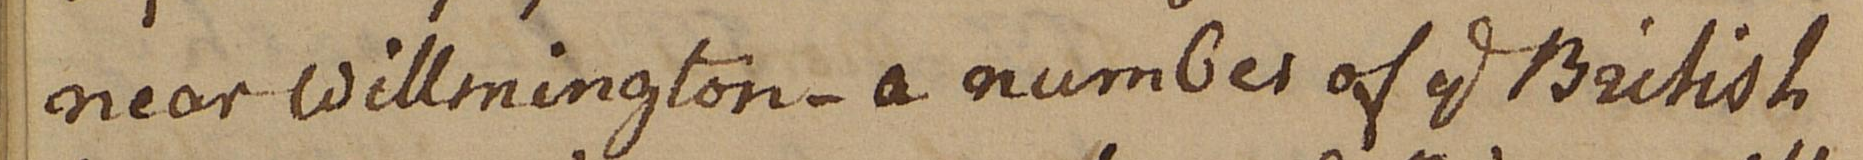near Willmington- a number of y^e British
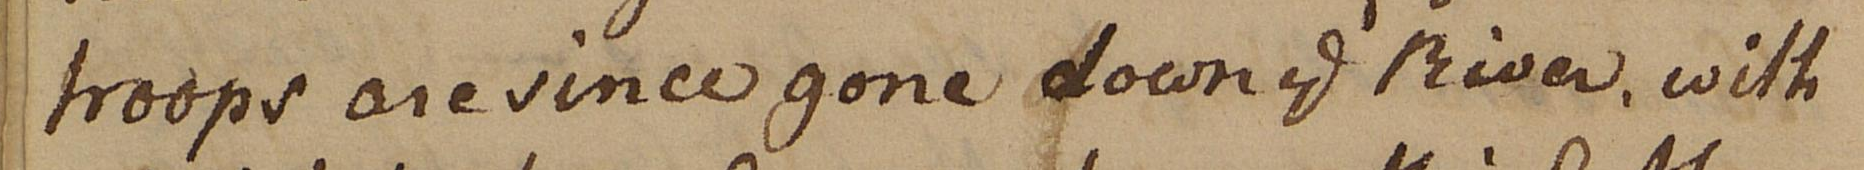troops are since gone down y^e River, with
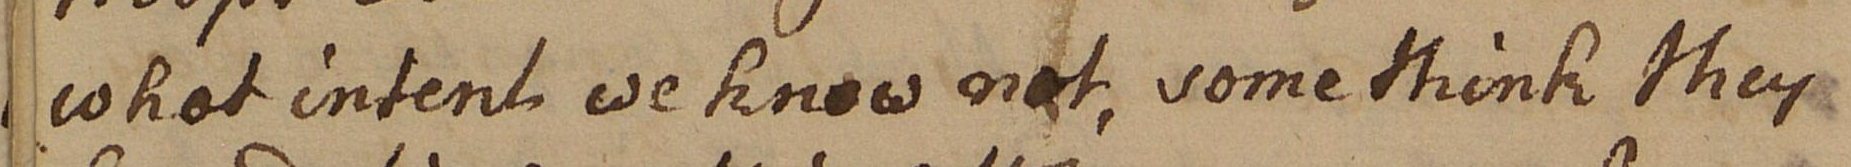what intent we know not, some think they
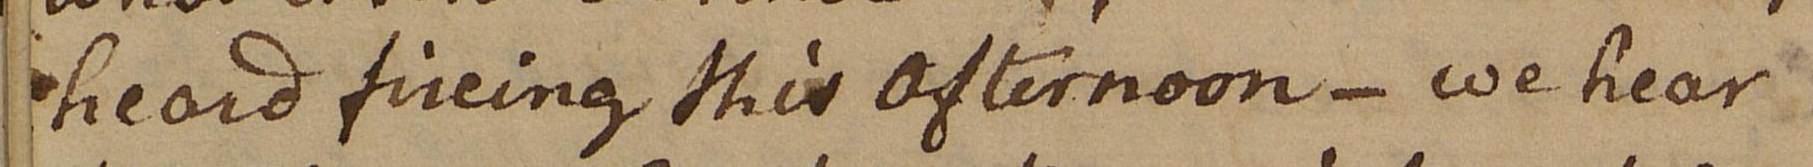heard fireing this afternoon- we hear
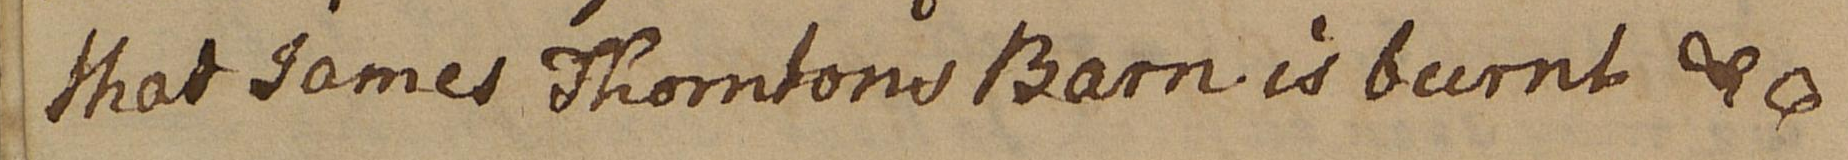that James Thorntons Barn is burnt &c
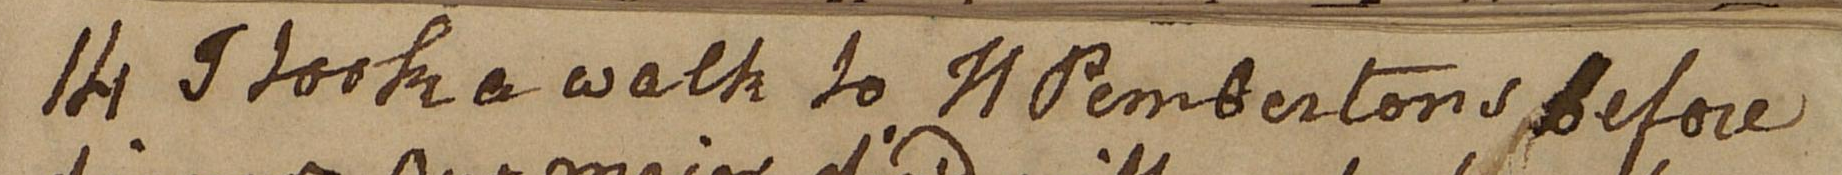14 I took a walk to H Pembertons before,
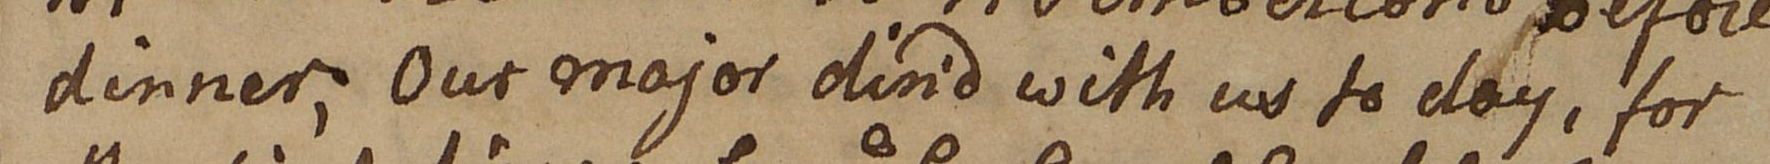dinner, Our major din'd with us to day, for
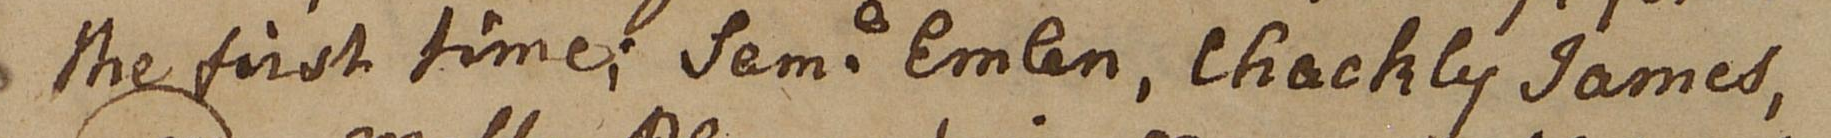the first time; Sam^l. Emlen, Chackly James,
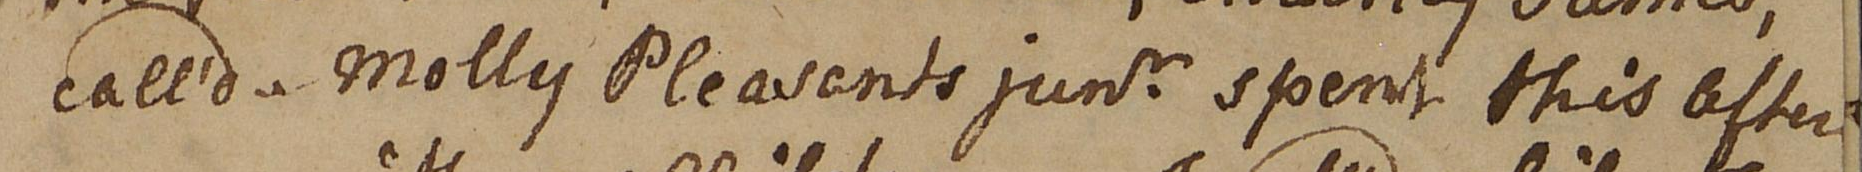call'd- Molly Pleasants jun^r. spent this after
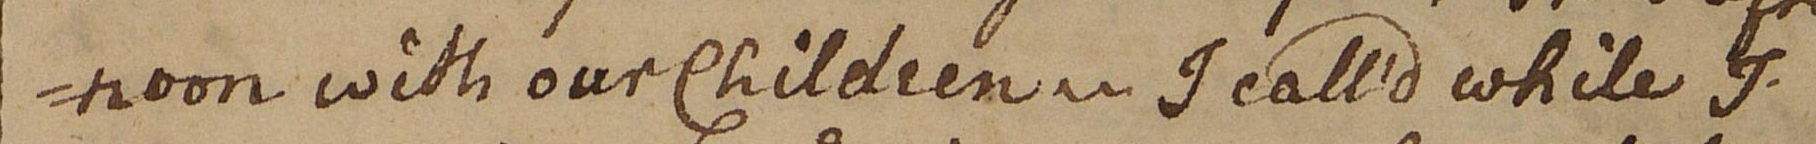-noon with our Children- I call'd while T.
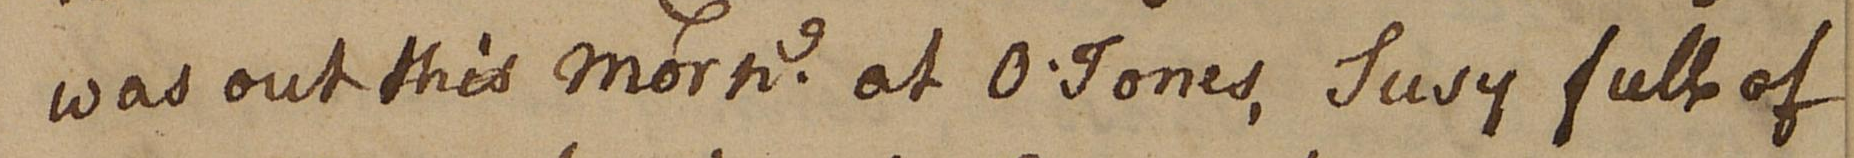was out this morn^g. at O'Jones, Susy full of
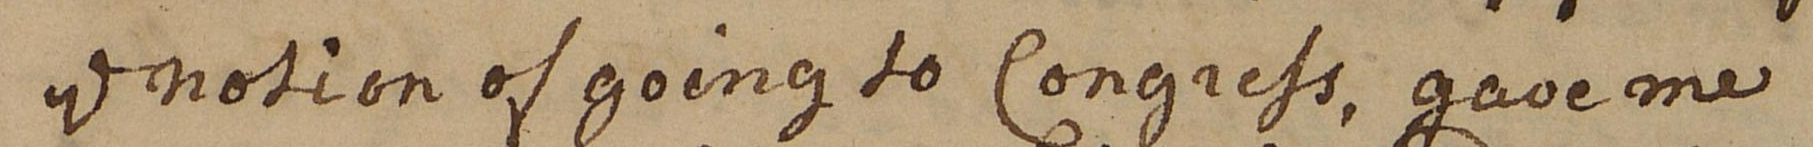y^e notion of going to Congress, gave me
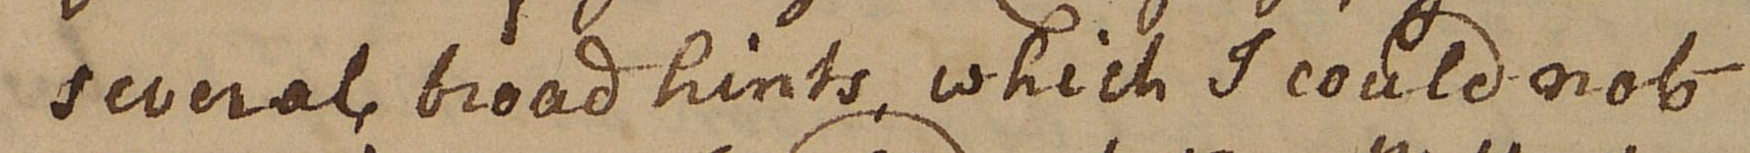several broad hints, which I could not
